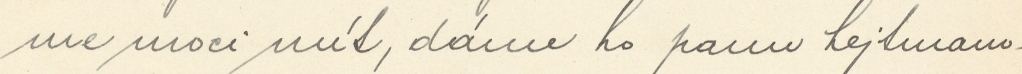me moci mít, dáme ho panu hejtmano-
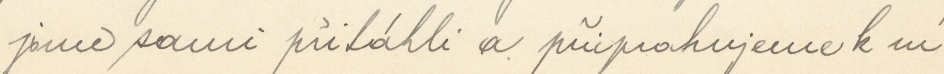jsme sami přitáhli a připrahujeme k ní
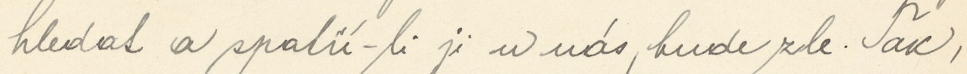hledat a spatří-li ji u nás, bude zle. Tak,
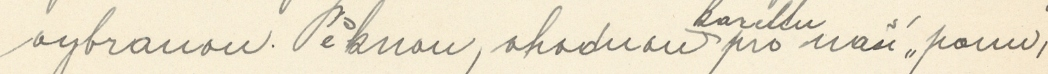vybranou. Pěknou, vhodnou karettu pro naší „ponu“,
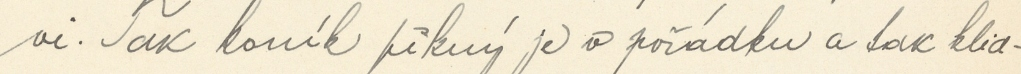vi. Tak koník pěkný je v pořádku a tak klid-
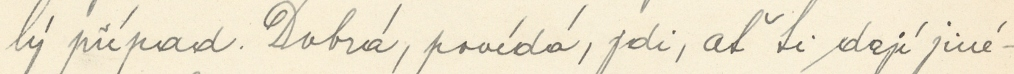lý případ. Dobrá, povídá, jdi, ať ti dají jiné-
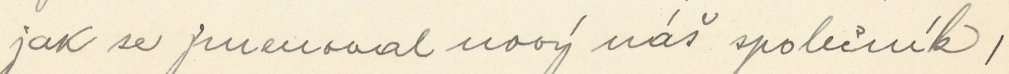jak se jmenoval nový náš společník,
